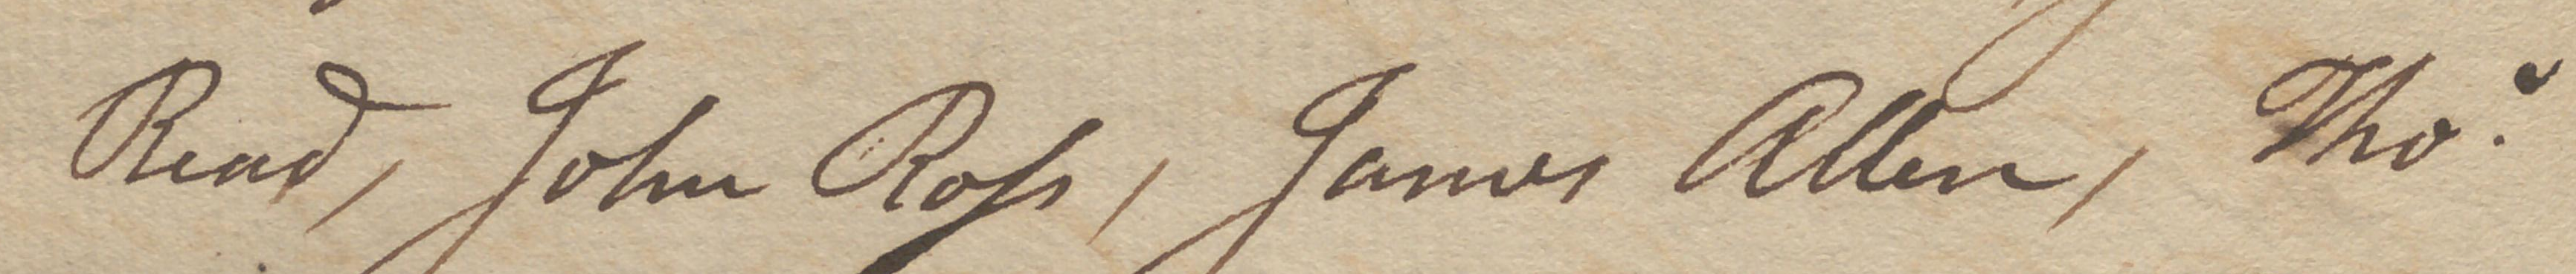Read, John Ross, James Allen, Tho^s.
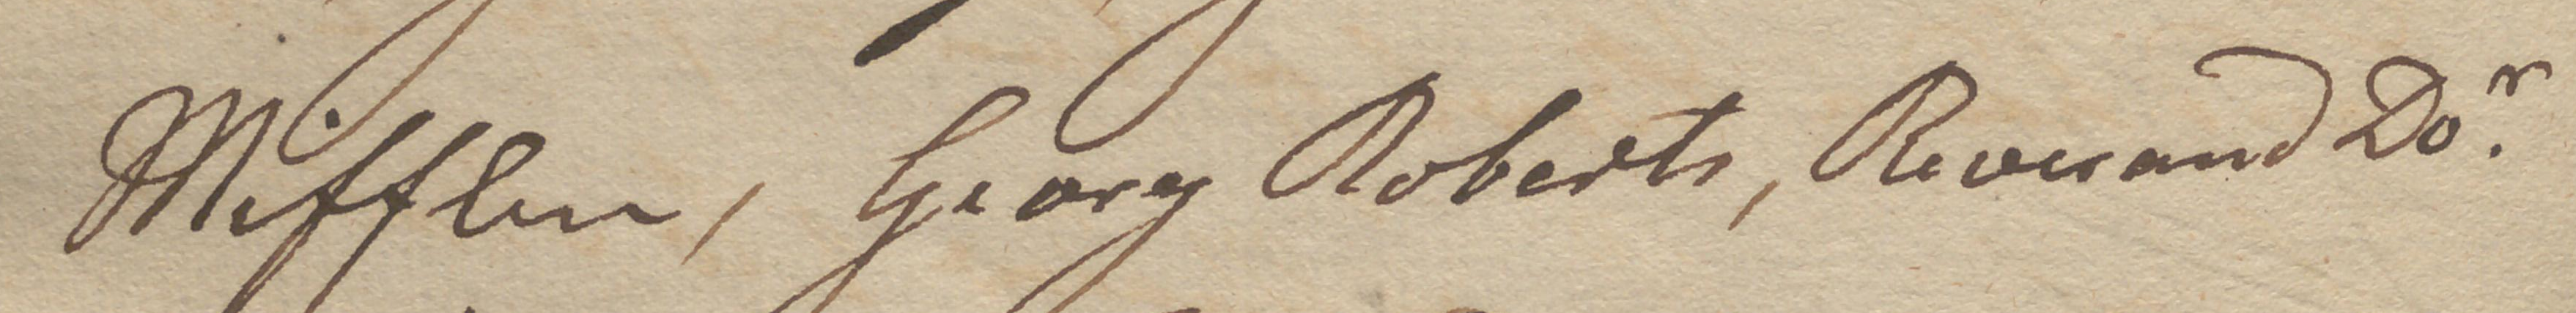Mifflin, Georg Roberts, Reverand Do^r.
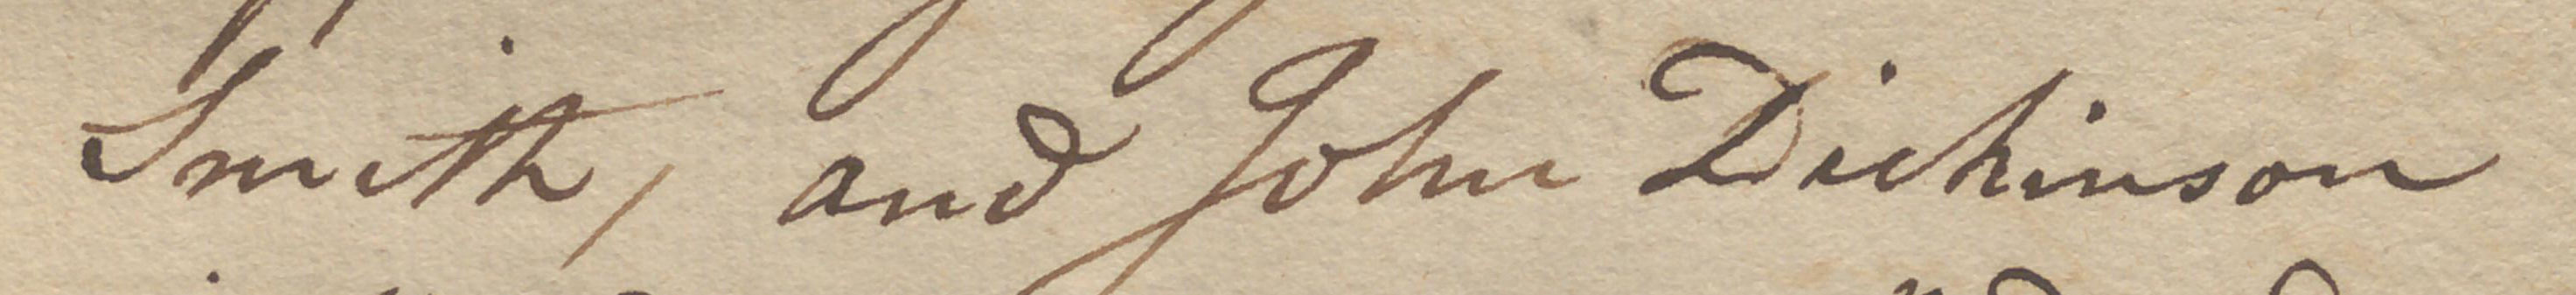Smith, and John Dickinson
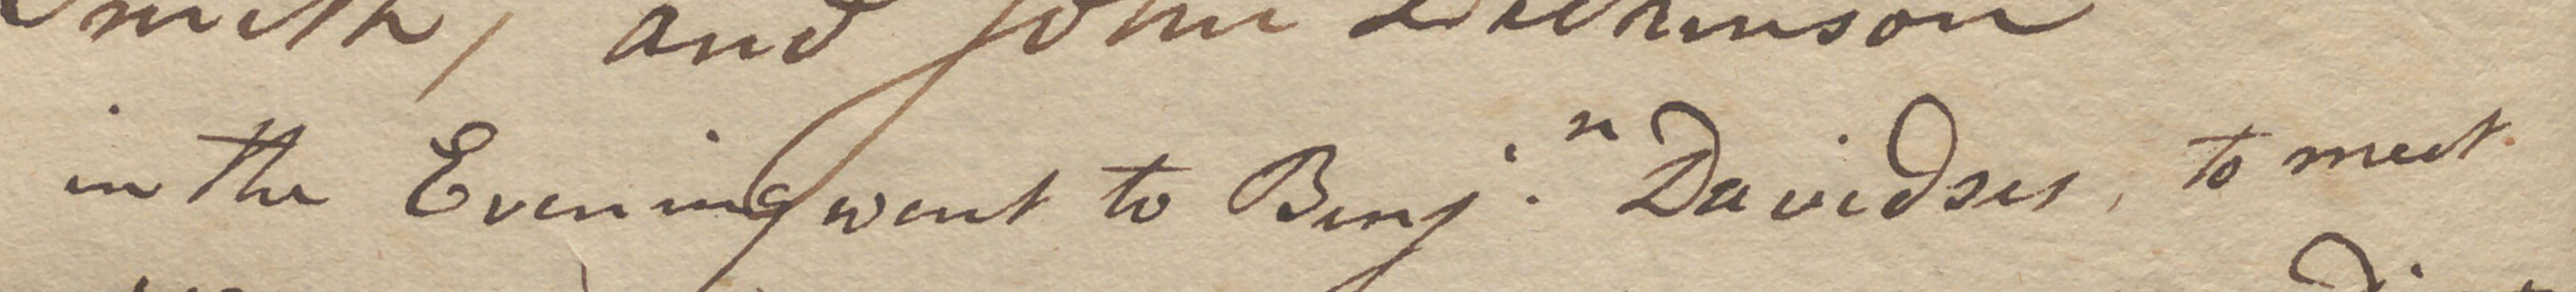in the Evenig went to Benj^n. Davidses, to meet
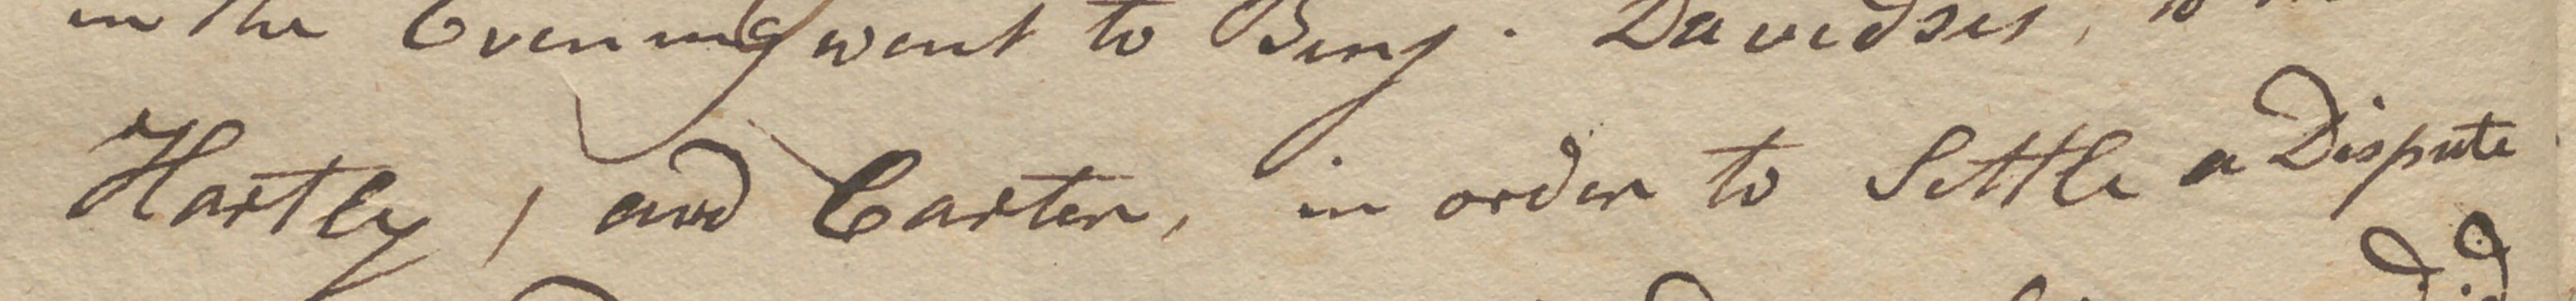Hartly, and Carter, in order to Settle a Dispute
